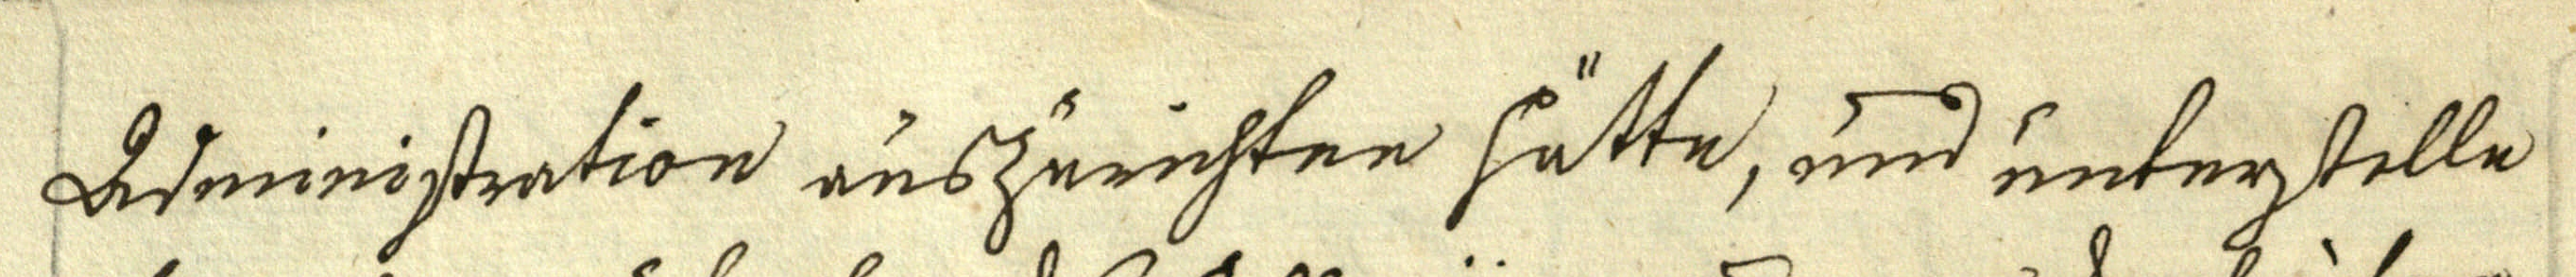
Administration auszurichten hätte, und unterstelle
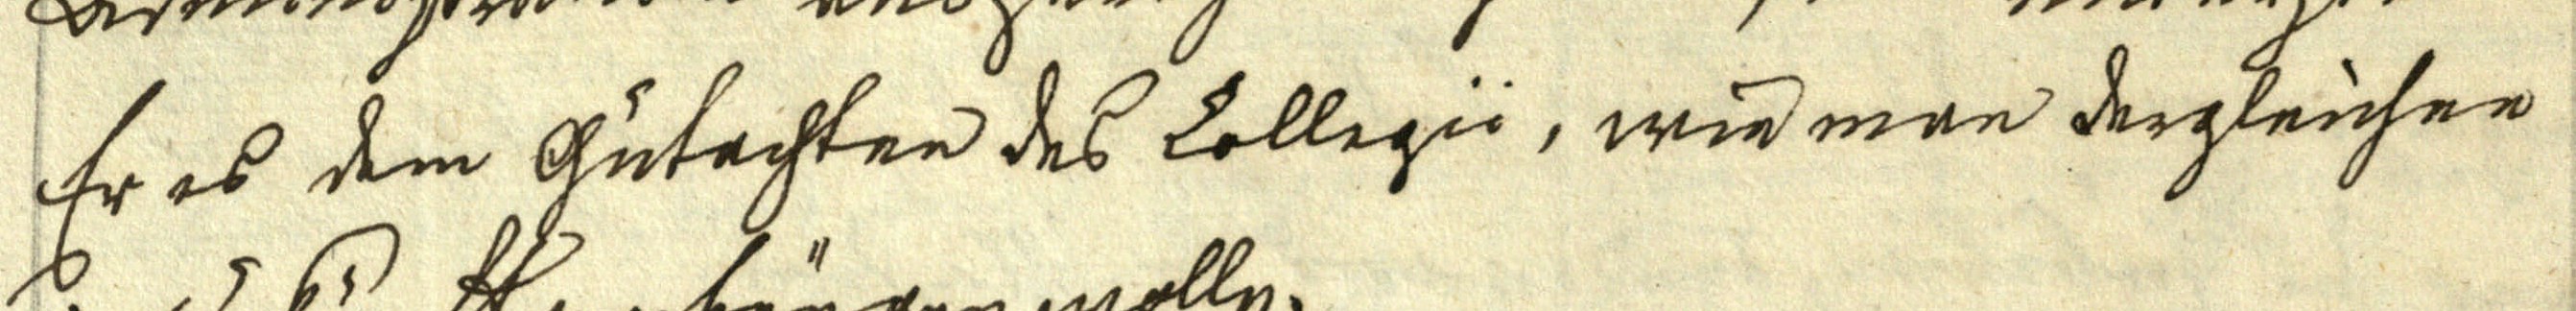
Er es dem Gutachten des Collegii, wie man dergleichen
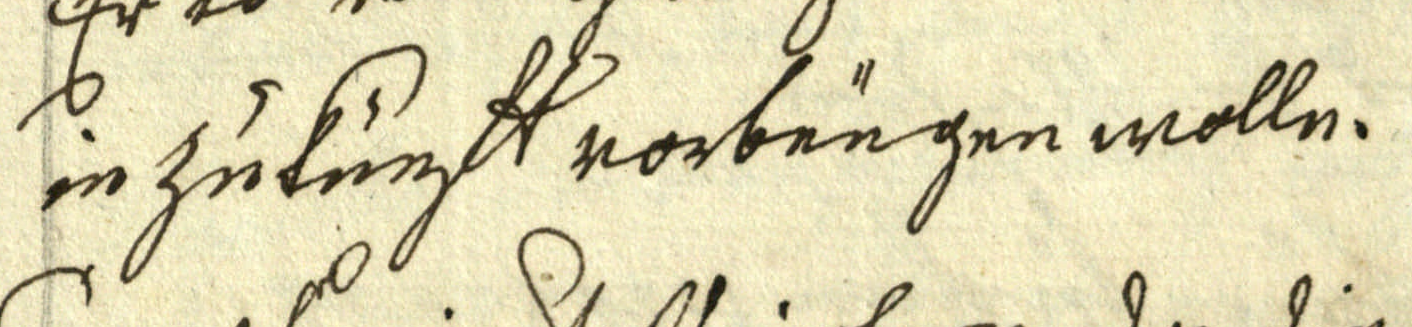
in Zukunft vorbeugen wolle.
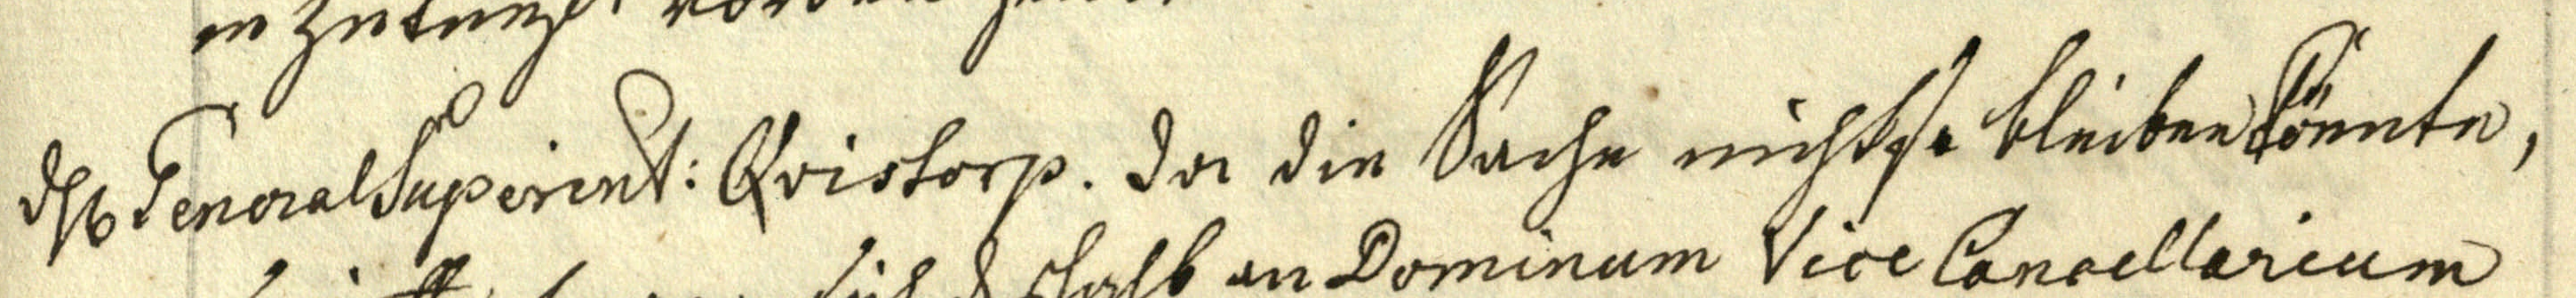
dh GeneralSuperint. Quistorp da die Sache nicht so bleiben könnte,
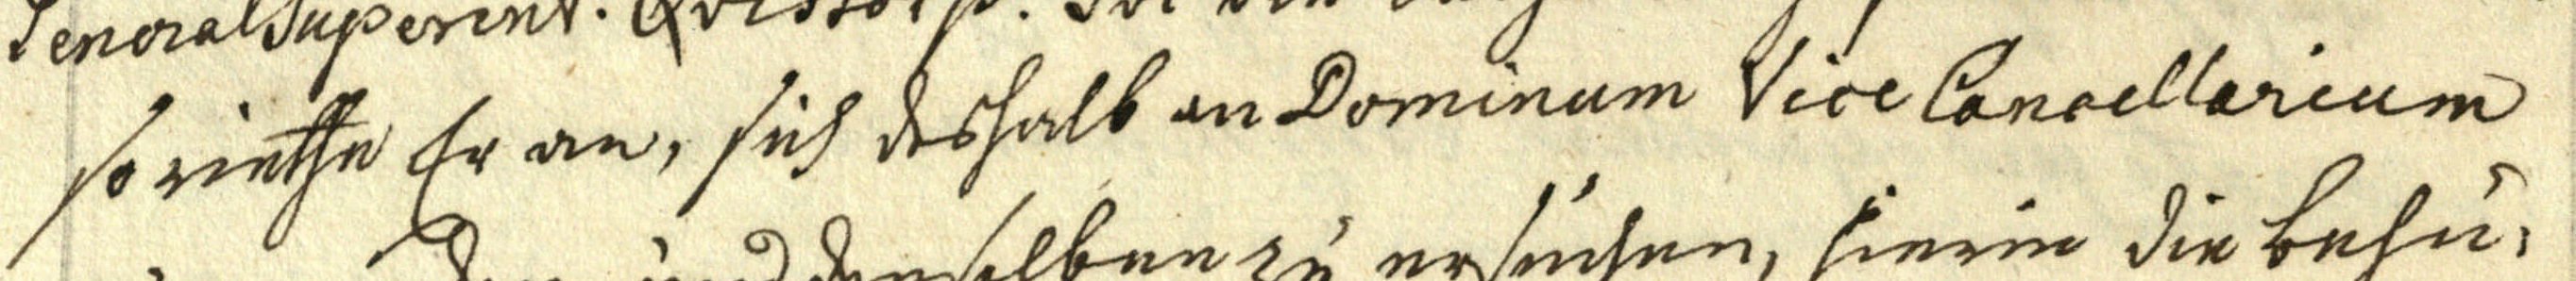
so riethe Er an, sich deshalb an Dominum Vice Cancellarium
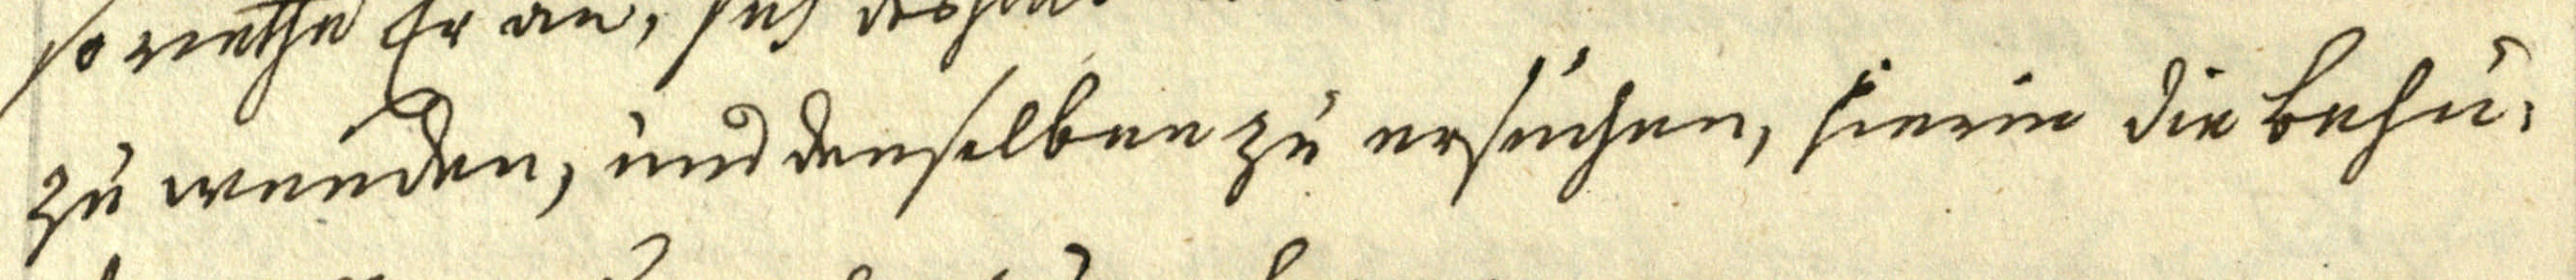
zu wenden, und denselben zu ersuchen, hierin die behu¬
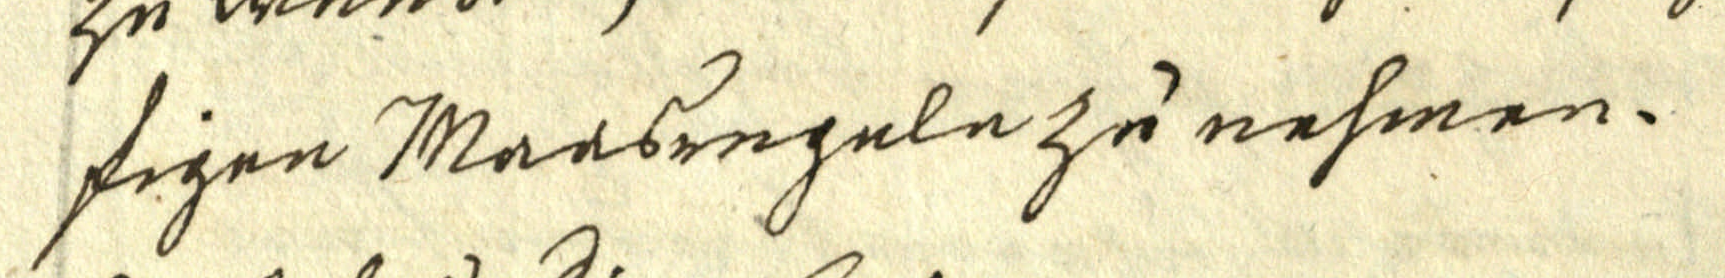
figen Maasregeln zu nehmen.
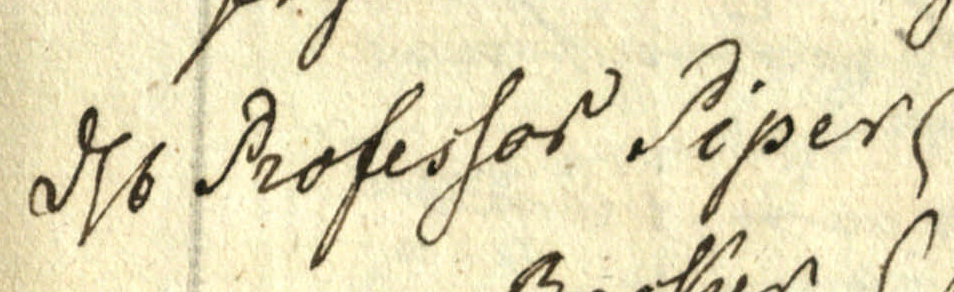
dh Professor Piper
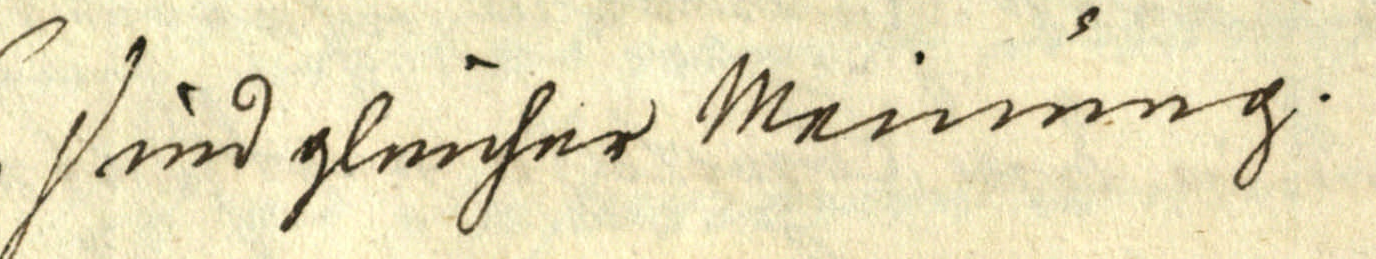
sind gleicher Meinung
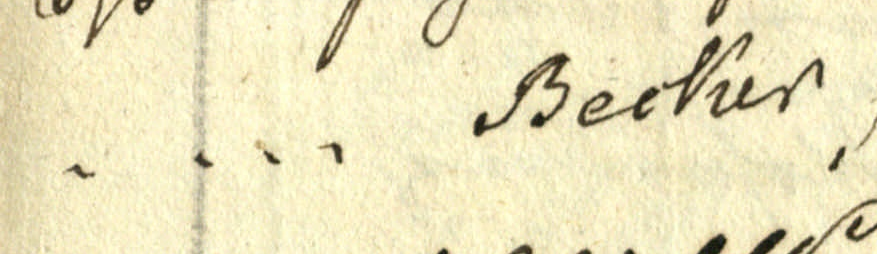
Becker
